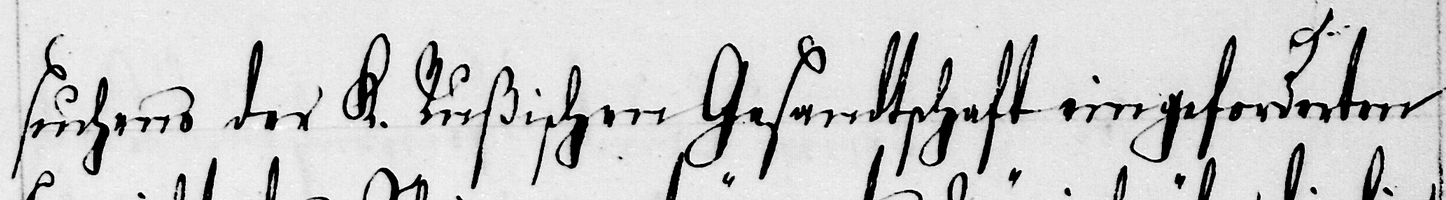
suchens der K. Rußischen Gesandtschaft eingeforderten
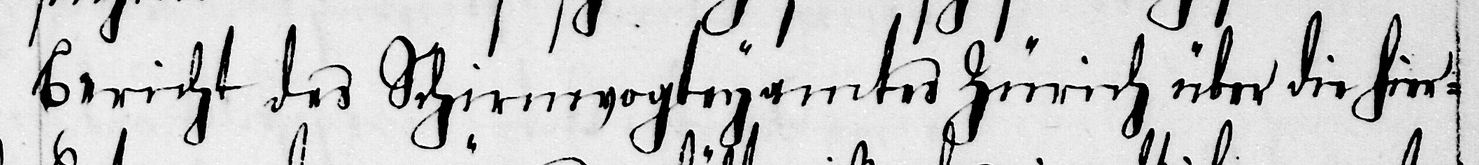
Bericht des Schirmvogteyamtes Zürich über die hier¬
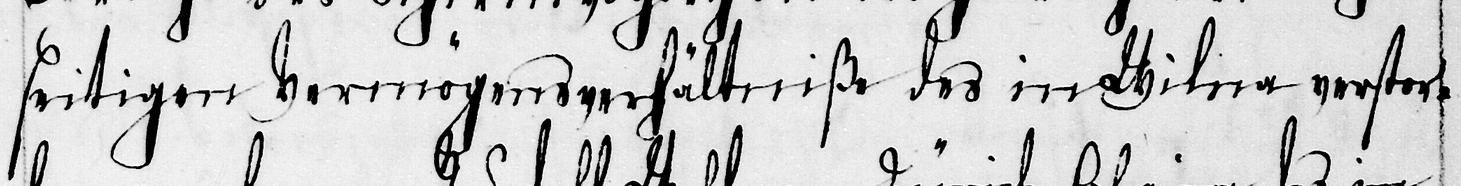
seitigen Vermögensverhältniße des in Wilna verstor¬
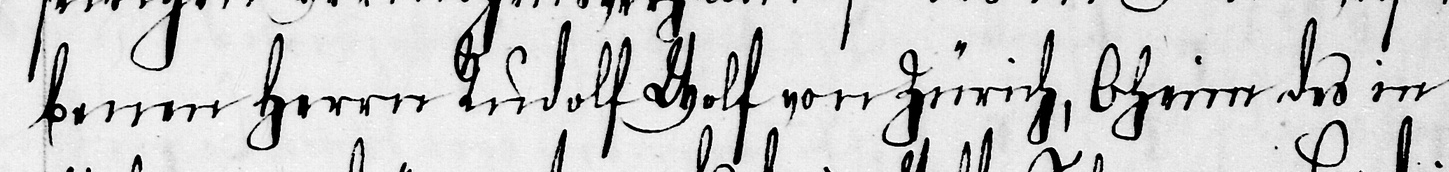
benen Herrn Rudolf Wolf von Zürich, Oheim des in
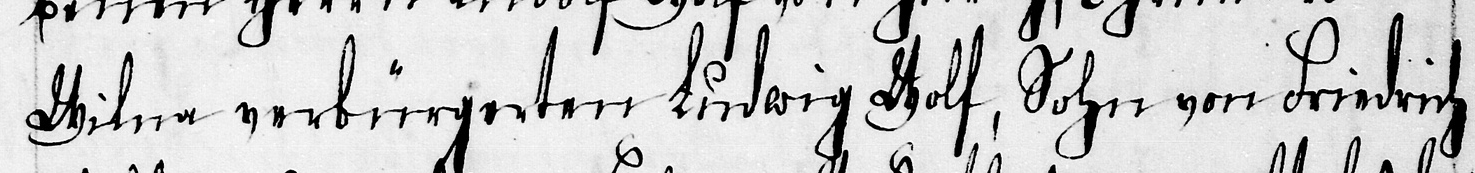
Wilna verbürgerten Ludwig Wolf, Sohn von Friedri¬
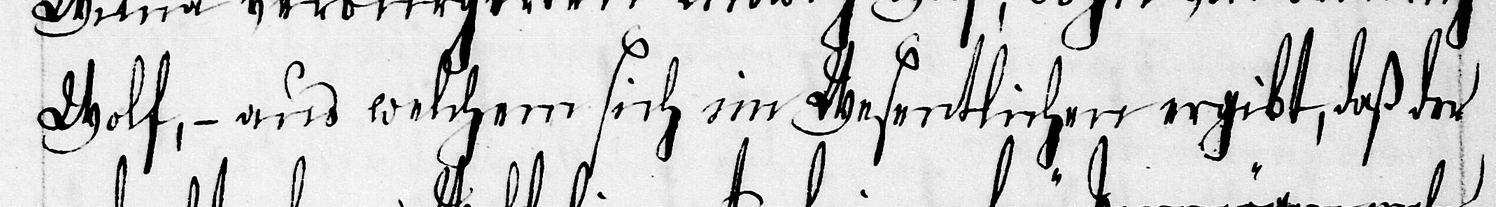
Wolf, – aus welchem sich im Wesentlichen ergibt, daß der
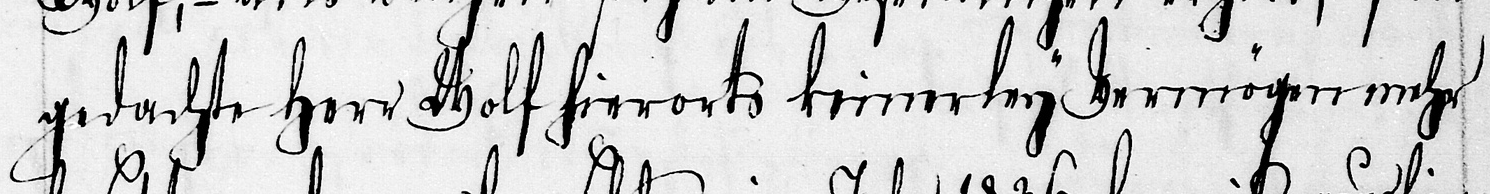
gedachte Herr Wolf hierorts keinerley Vermögen mehr
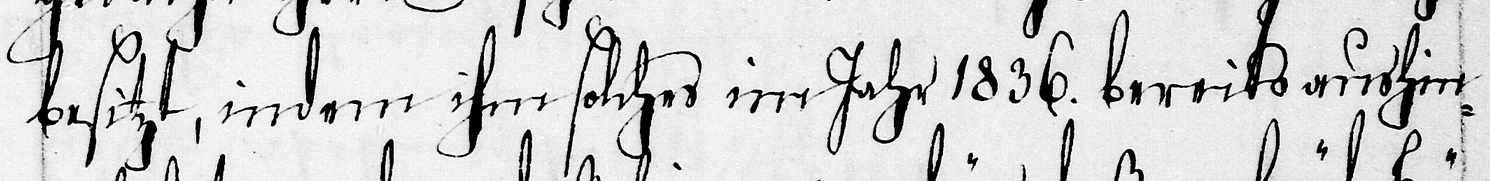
besitzt, indem ihm solches im Jahr 1836. bereits aushin¬
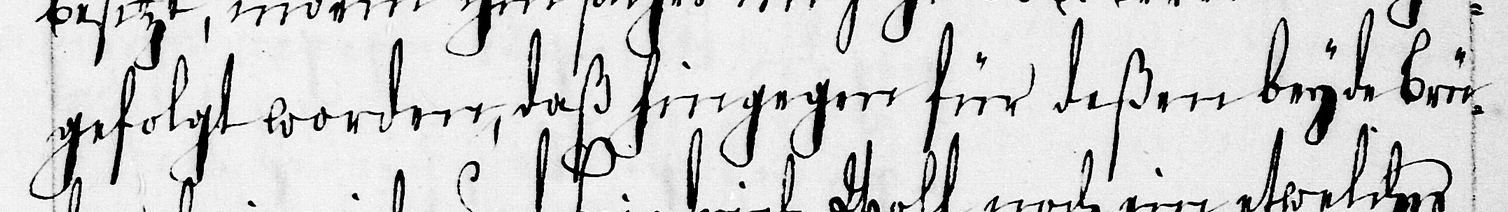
gefolgt worden, daß hingegen für deßen beyde Brü¬
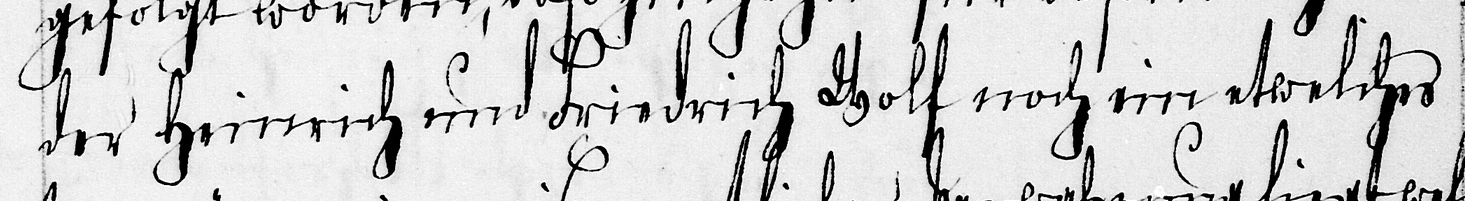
der Heinrich und Friedrich Wolf noch ein etwelches
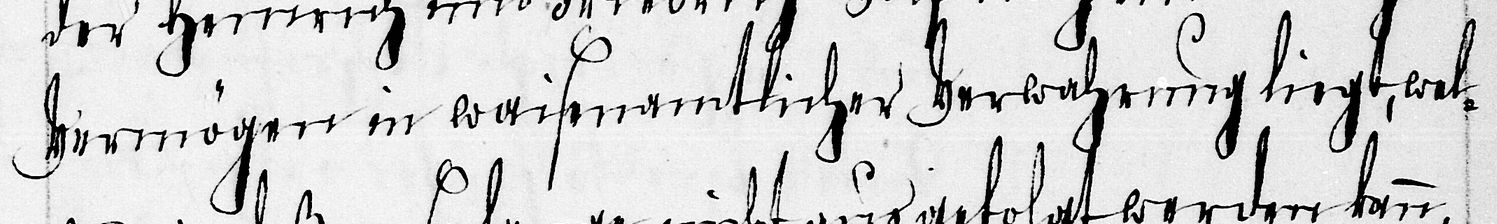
Vermögen in waisenamtlicher Verwahrung liegt, wel¬
